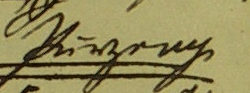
Purzengasse
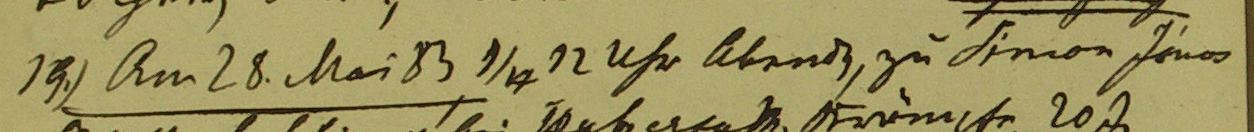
19. Am 28. Mai 83, ¼ 12 Uhr Abends, zu Simon Janos,
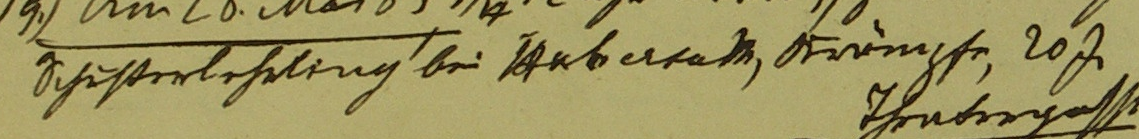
Schusterlehrling bei Hubernak, 20 J. Krämpfe,
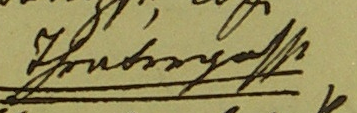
Theatergasse
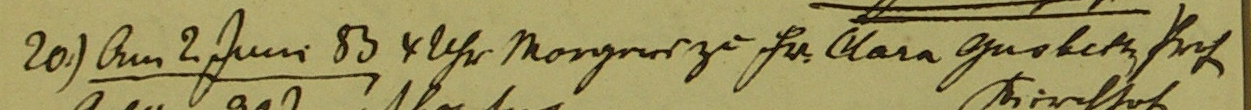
20. Am 2. Juni 83, 4 Uhr Morgens, zu Fr. Clara Gusbeth, Prof.
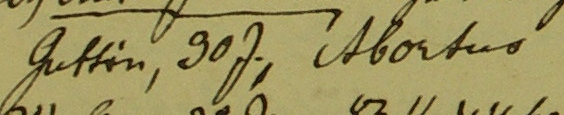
Gattin, 30 J. Abortus
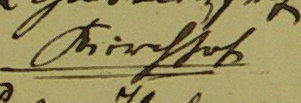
Kirchhof
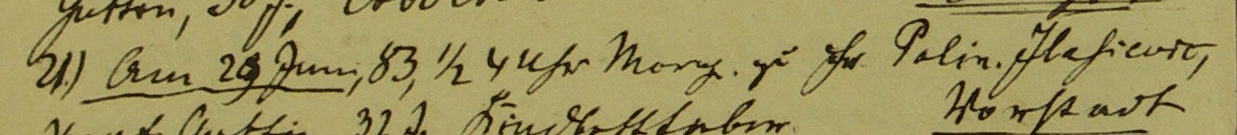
21. Am 29. Juni 83, ½ 4 Uhr Morg. zu Fr. Polin. Ilafiewicz
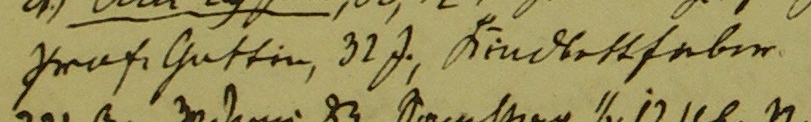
Prof. Gattin, 32. J. Kindbettfieber
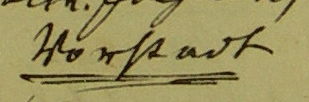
Vorstadt
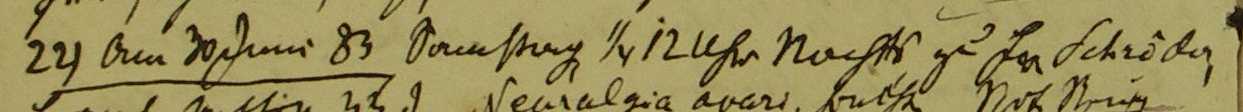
22. Am 30. Juni 83, Samstag ¼ 12 Uhr Nachts, zu Fr. Schröder
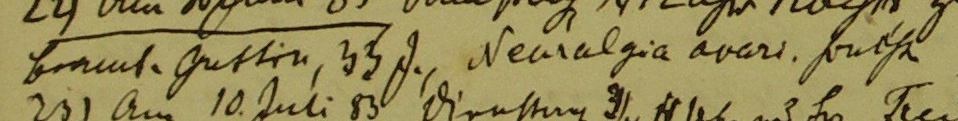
Beamt. Gattin 33 J. Neuralgia avaris Burgg.
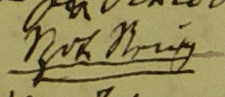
Spot Ring
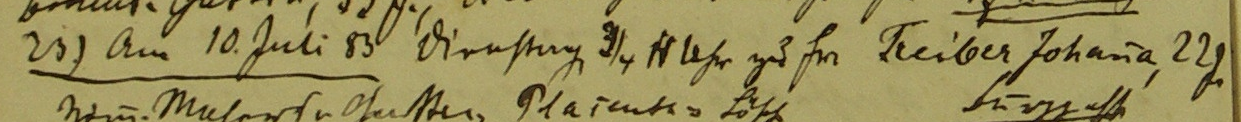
23. Am 10. Juli 83, Dienstag, ¾ 11 Uhr , zu Fr. Treiber Johanna, 22 J.
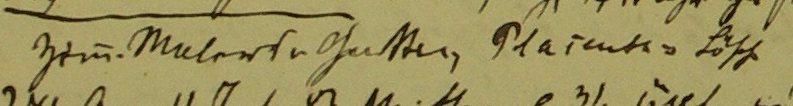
Zimmer. Malers Gattin, Placenta = Lösch
